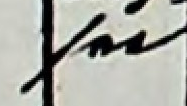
see
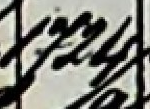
724/a
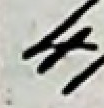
4
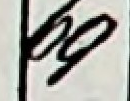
69
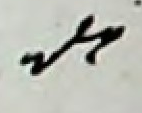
Do
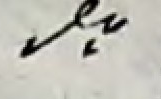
Do
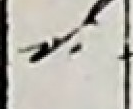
Do
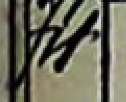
74
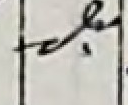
Do
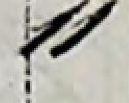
11
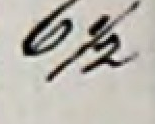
6 1/2
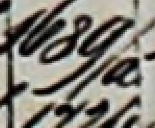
1689/a
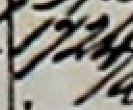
1724/a
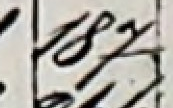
187
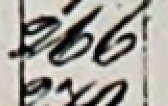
266
